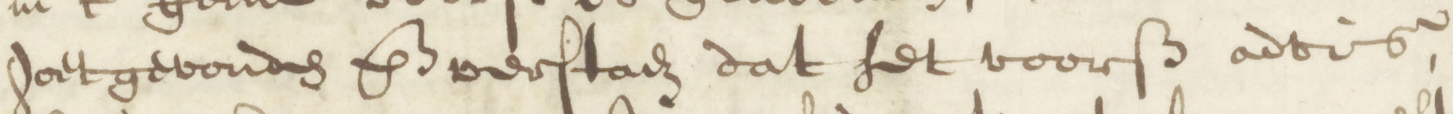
goetgevonden & verstaen dat het voors advis,
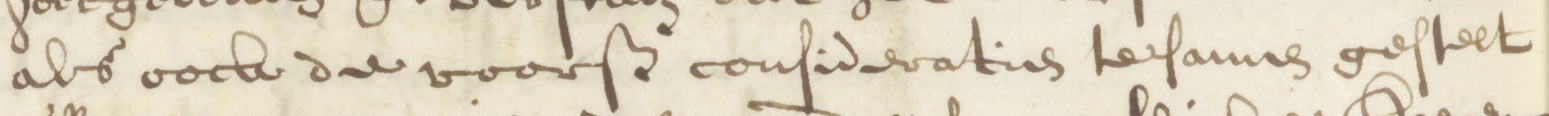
als oock de voors consideratien tesamen gestelt
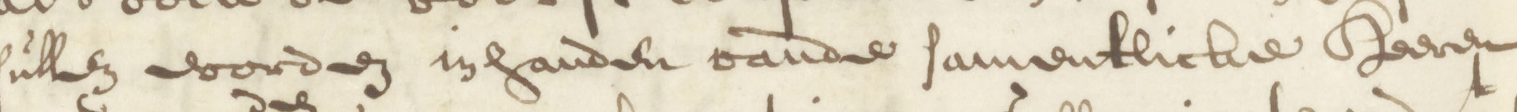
sullen worden in handen vande samentlicke Heeren
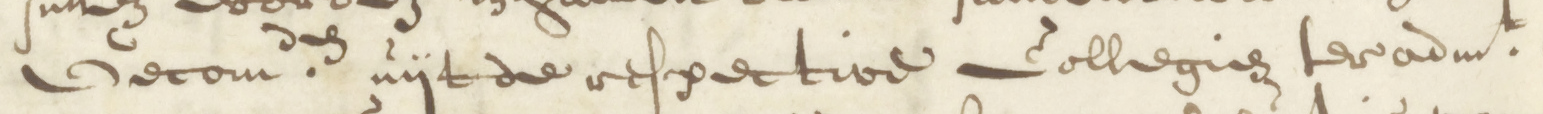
Gecomden. uijt de respective Collegien ter admt.,
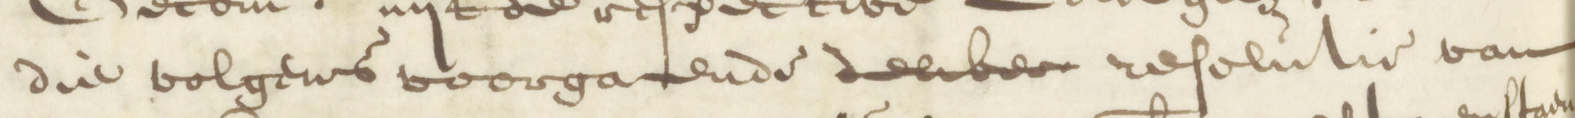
die volgens voorgaende deliber resolutie van
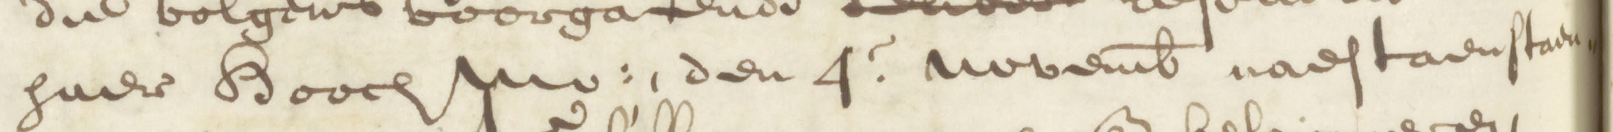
haer HoochMo:, den 4e. novemb naestaenstaen„
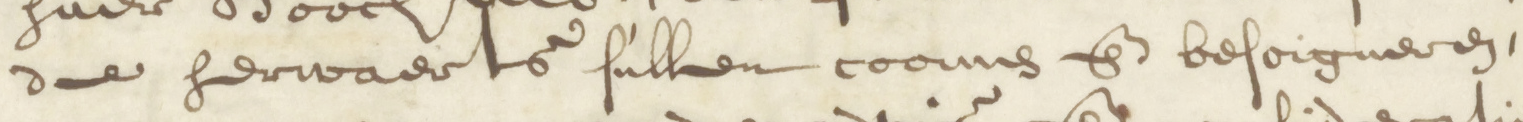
de herwaerts sullen coomen & besoigneren,
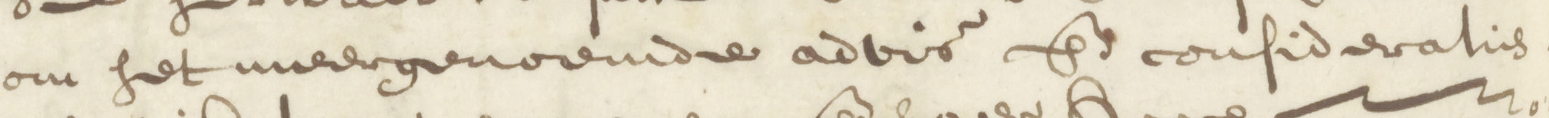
om het meergenoemde advis & consideratien
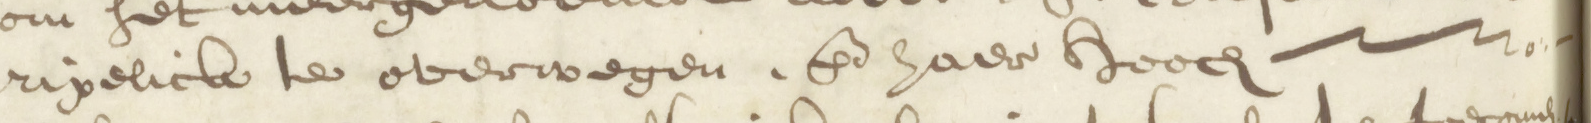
ripelick te overwegen, & haer Hooch Mo:
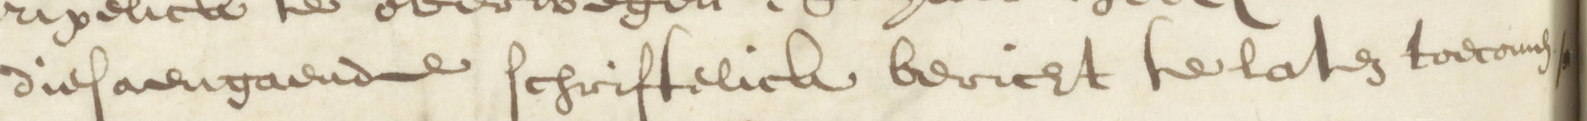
diesaengaende schriftelick bericht te laten toecomen
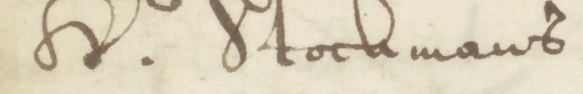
Hr. Stockmans
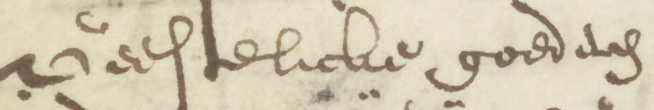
Geestelicke goederen
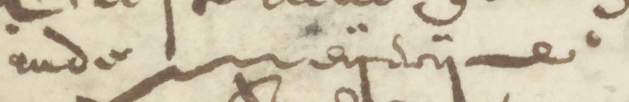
inde Meijerije.
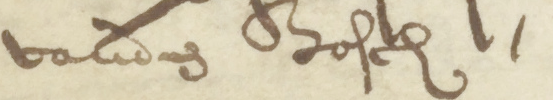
vanden Bosch.
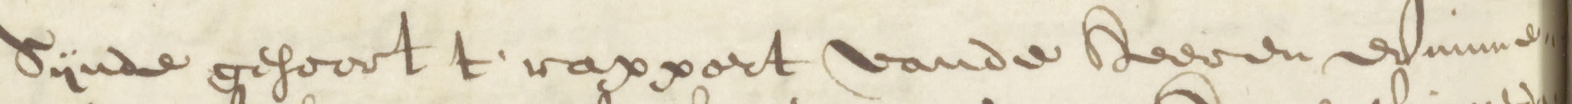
Sijnde gehoort t' rapport vande Heeren Wimme„
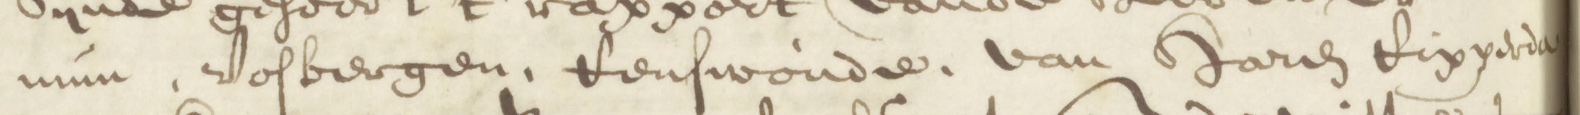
num, Vosbergen, Renswoude, van Haren Ripperda
